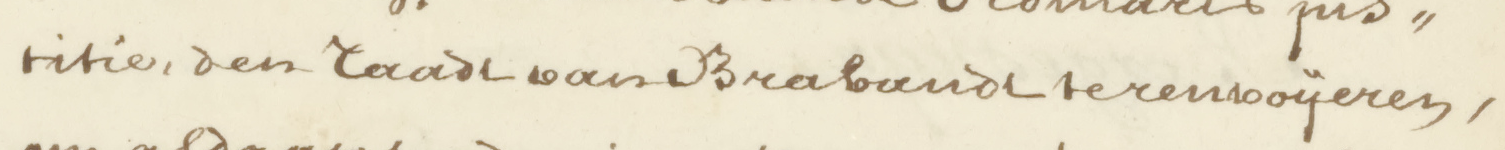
titie, den Raadt van Brabandt te renvoijeren,
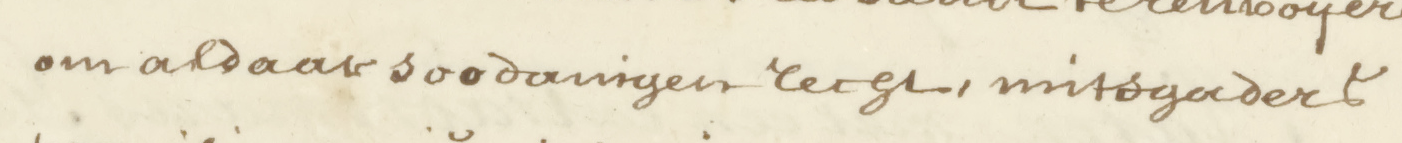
om aldaar soodanigen recht, mitsgaders
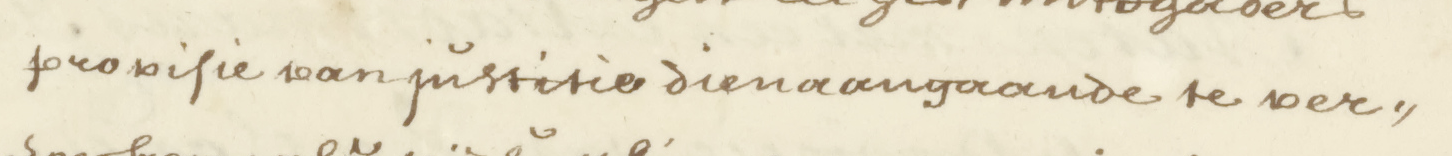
provisie van justitie dienaangaande te ver„
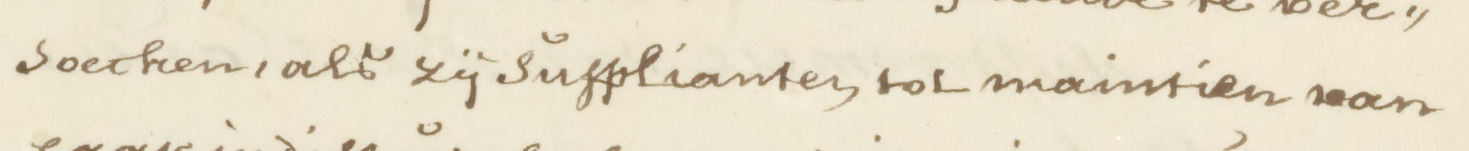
soecken, als zij supplianten tot maintien van
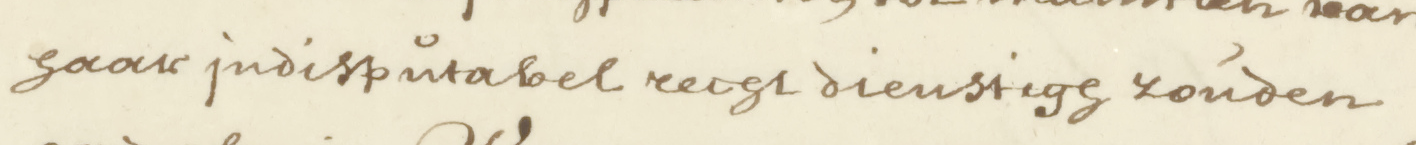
haar indisputabel recht dienstigh zouden
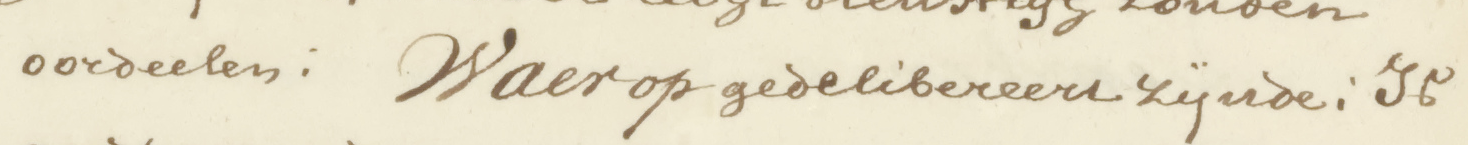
oordeelen: Waerop gedelibereert zijnde: Is
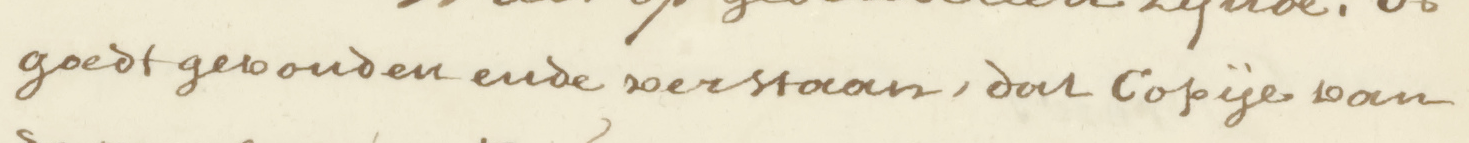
goedt gevonden ende verstaan, dat copije van
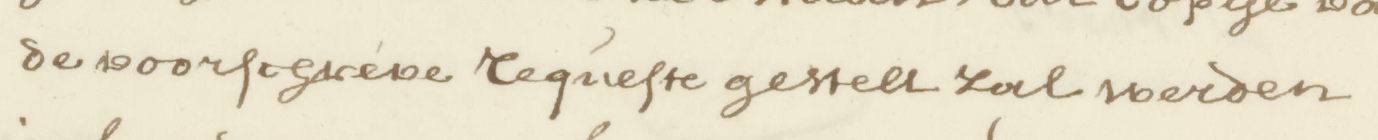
de voorschreve Requeste gestelt zal werden
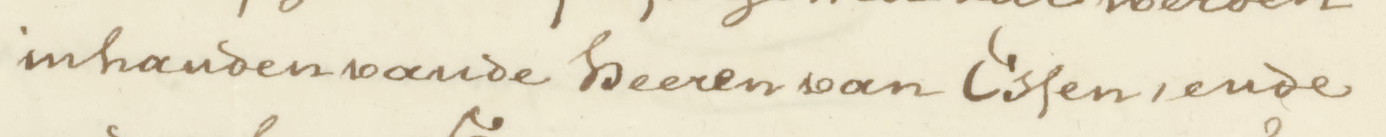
in handen vande heeren van Essen, ende
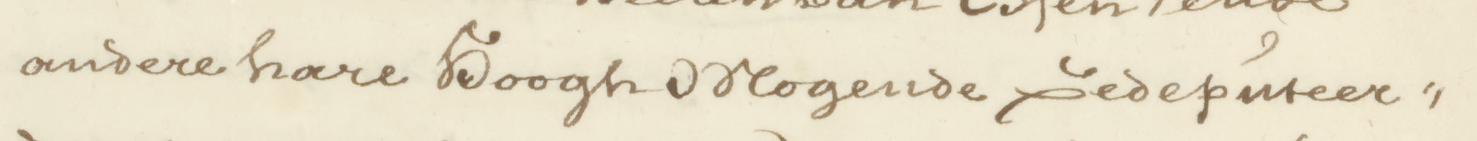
andere hare Hoogh Mogende Gedeputeer„
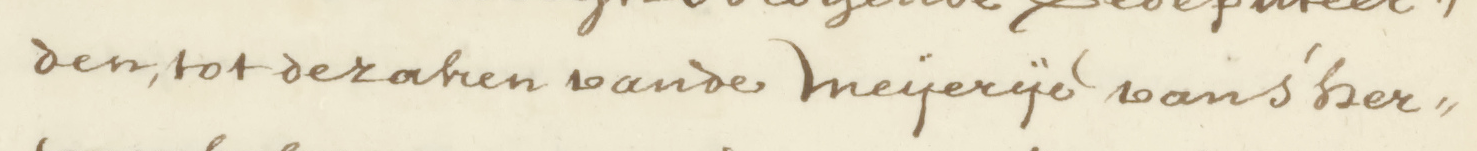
den, tot de zaken vande meijerije van s'her„
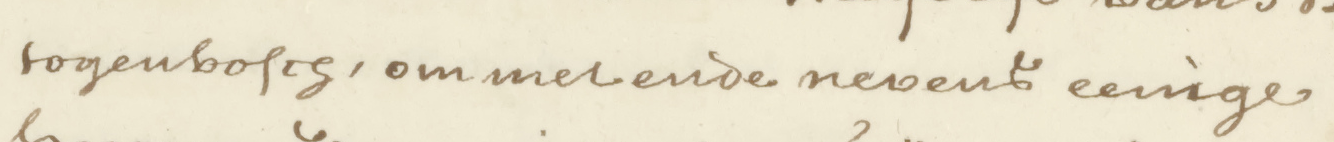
togenbosch, om met ende nevens eenige
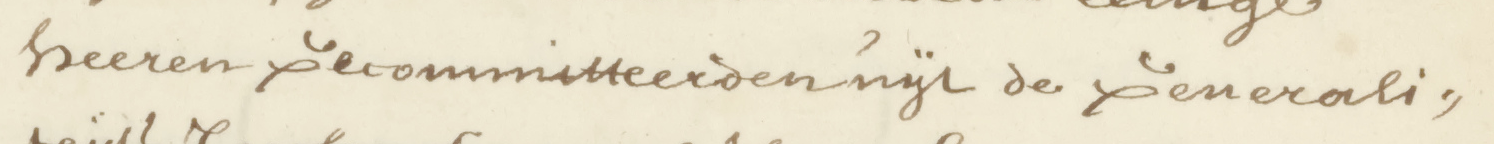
heeren Gecommitteerden uijt de Generali„
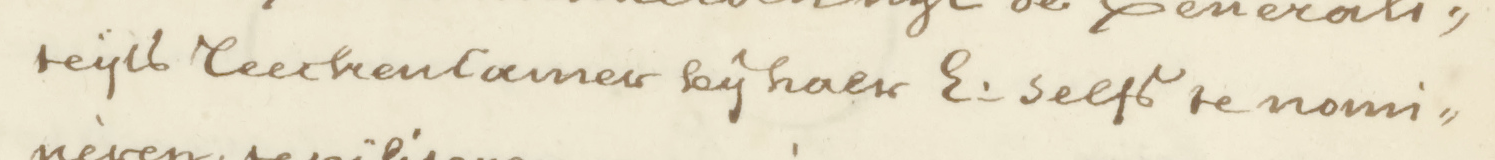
teijts Reeckencamer bij haer E. selfs te nomi„
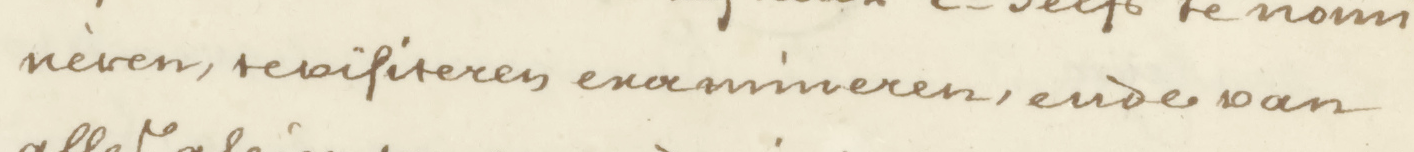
neren, te visiteren, examineren, ende van
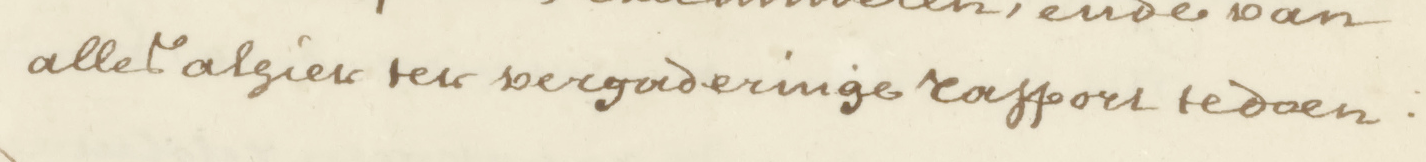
alles alhier ter vergaderinge rapport te doen.
